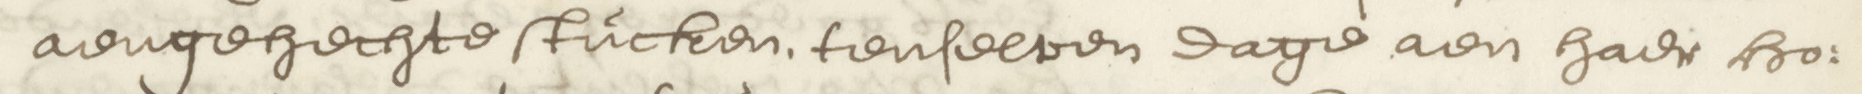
aengehechte stucken tenselven Dage aen haer Ho:
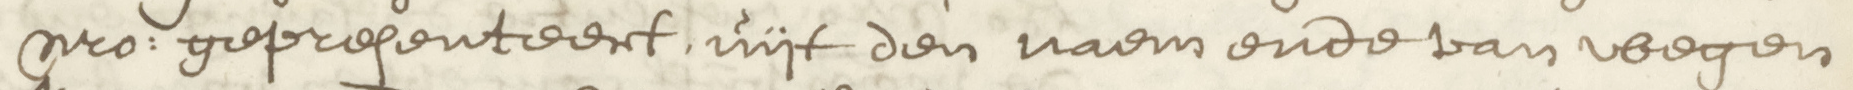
Mo: gepresenteert, uijt den naem ende van wegen
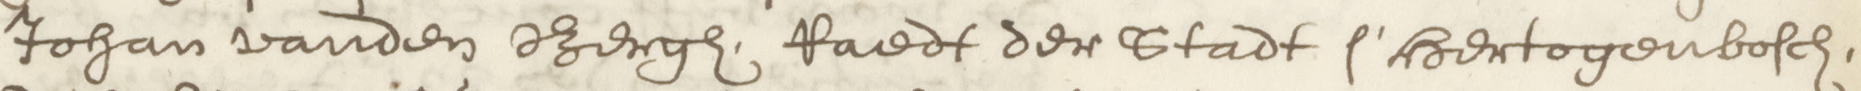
Johan vanden Bergh, Raedt der Stadt s'Hertogenbosch,
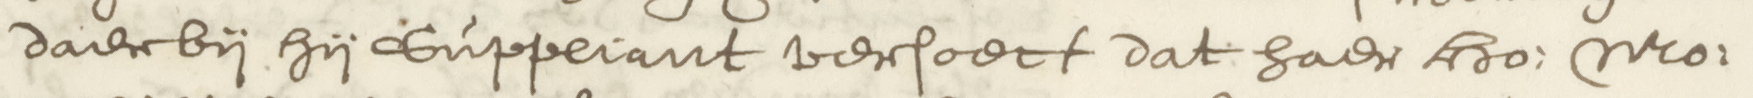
daerbij hij Suppliant versoect dat haer Ho:Mo:
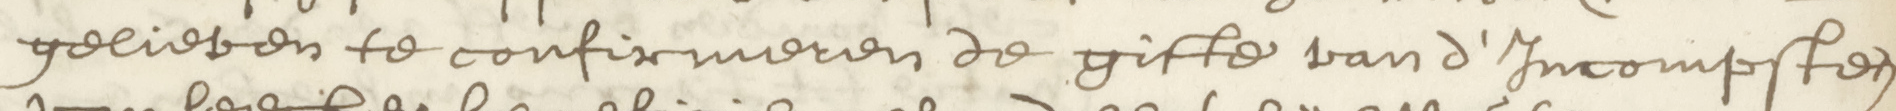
gelieven te confirmeren de gifte van d'Incompsten
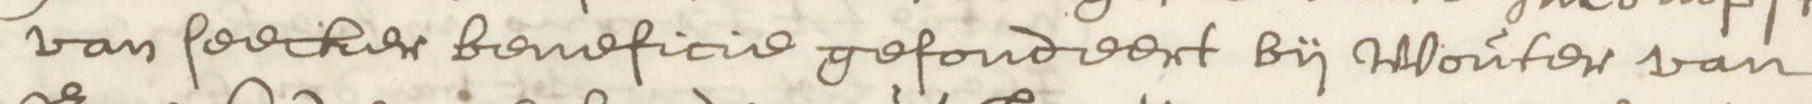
van seecker beneficie gefondeert bij Wouter van
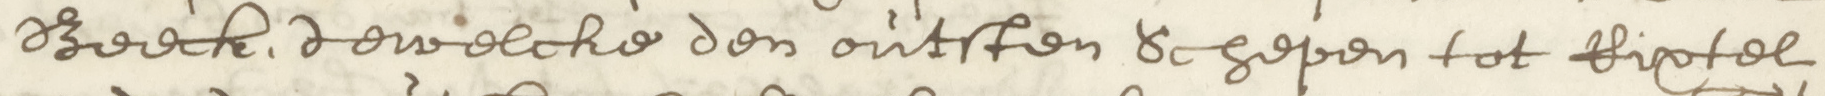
Beeck, dewelcke den outsten schepen tot Riptel
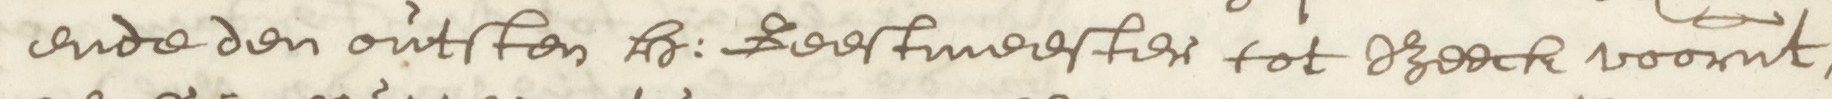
ende den outsten H: Geestmeester tot Beeck voornt
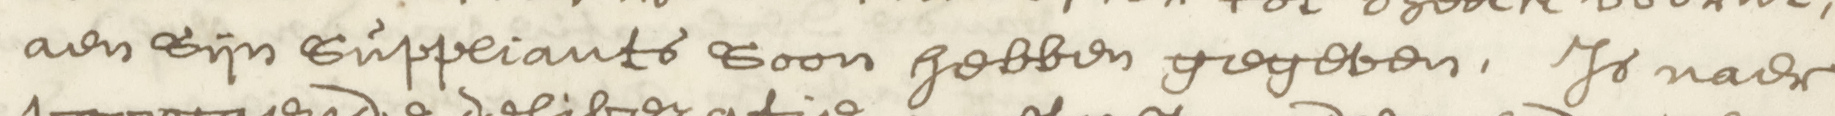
aen Sijn Suppliants Soon hebben gegeven, Is naer
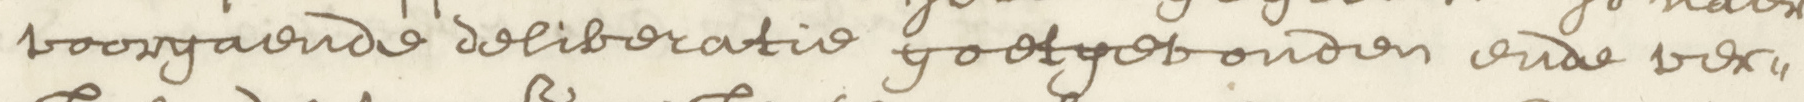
voorgaende deliberatie goetgevonden ende ver,,
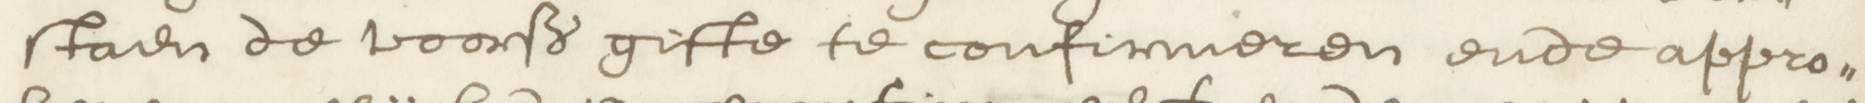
staen de voors gifte te confirmeren ende appro„
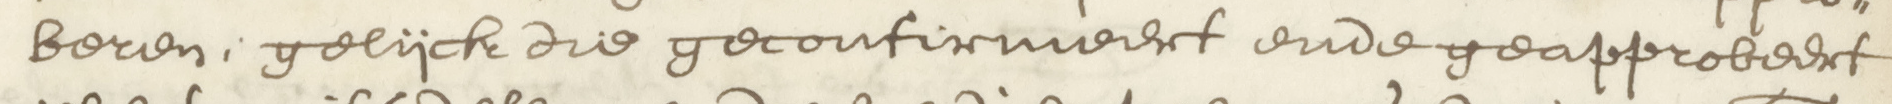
beren, gelijck die geconfirmeert ende geapprobeert
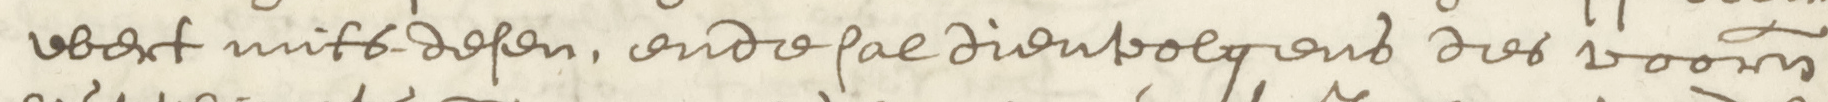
wert mits desen, ende sal dienvolgens des voorn
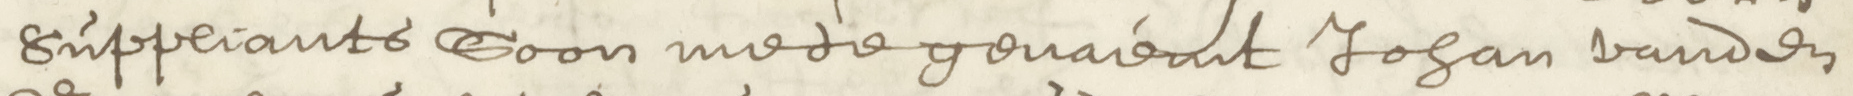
Suppliants Soon mede genaemt Johan vanden
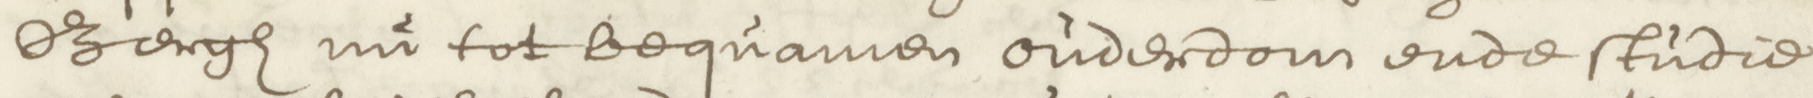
Bergh nu tot bequamen ouderdom ende studie
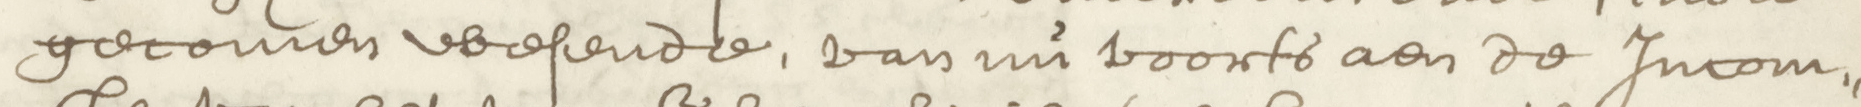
gecomen wesende, van nu voorts aen de Incom,,
